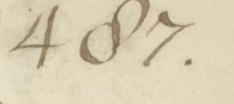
487.
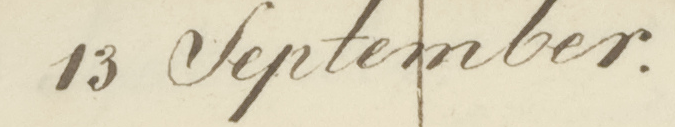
13 September.
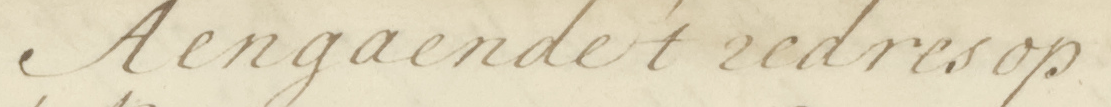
Aengaende 't redres op
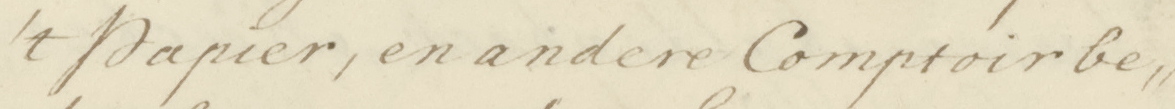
‛t Papier, en andere Comptoirbe„
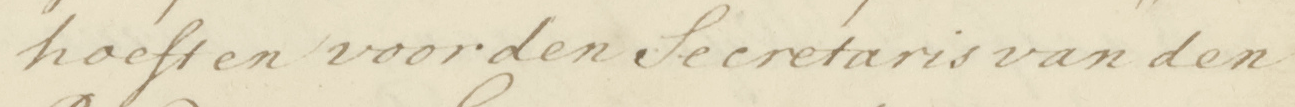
hoeften voor den Secretaris van den
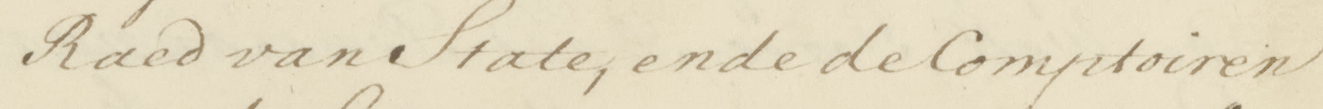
Raed van State, ende de Comptoiren
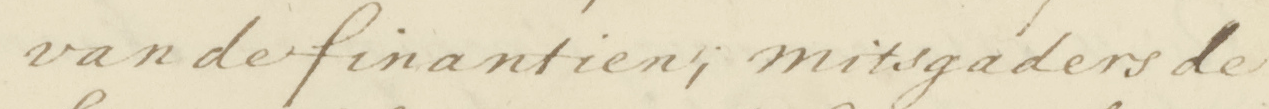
van de finantien; mitsgaders de
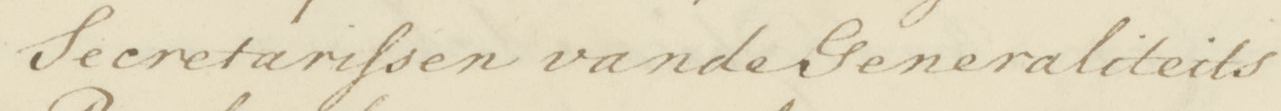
Secretarissen vande Generaliteits
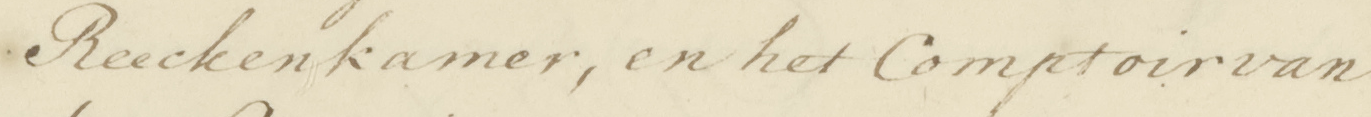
Reeckenkamer, en het Comptoir van
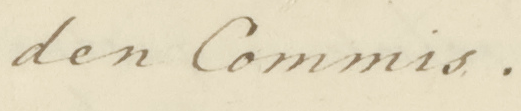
den Commis.
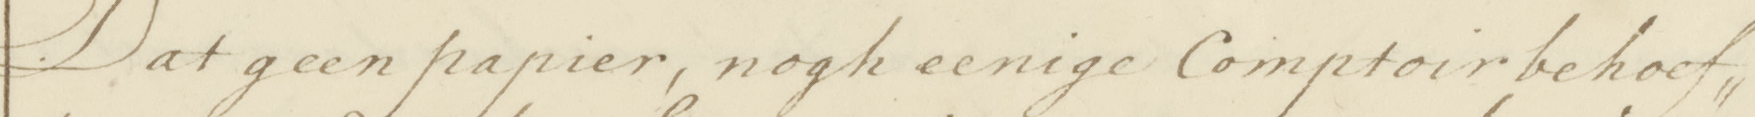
Dat geen papier, nogh eenige Comptoirbehoef„
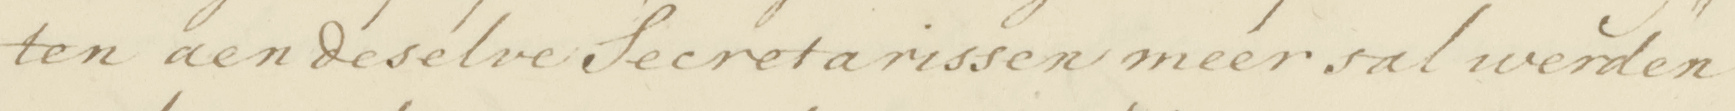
ten aen deselve Secretarissen meer sal werden
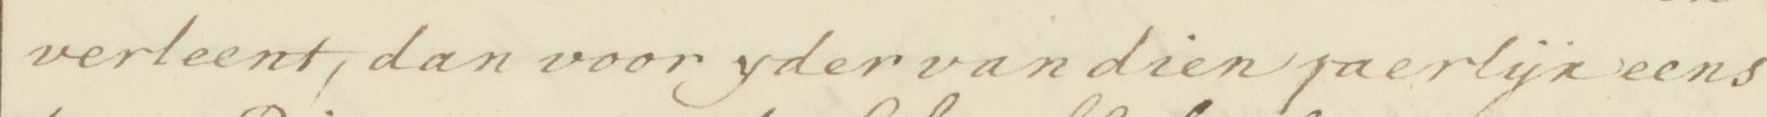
verleent, dan voor yder van dien jaerlijx eens
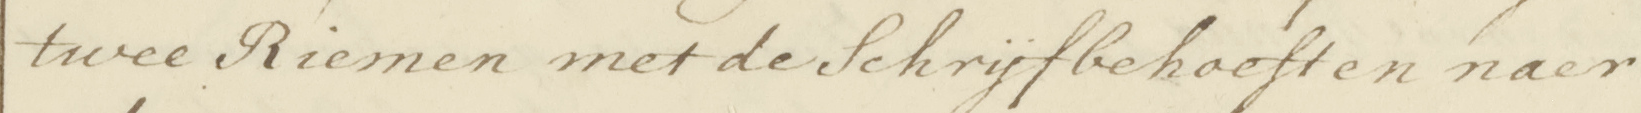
twee Riemen met de Schrijfbehoeften naer
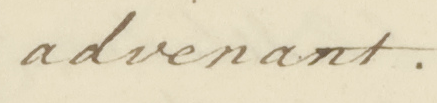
advenant.
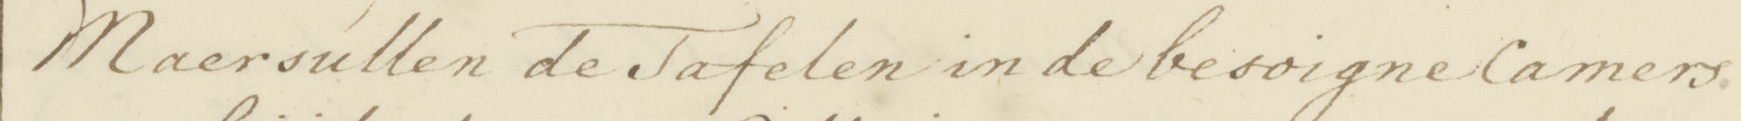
Maer sullen de Tafelen, in de besoigne Camers,
